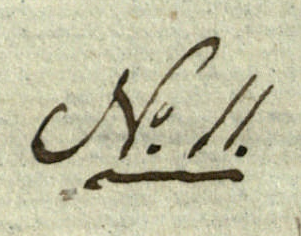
No 11.
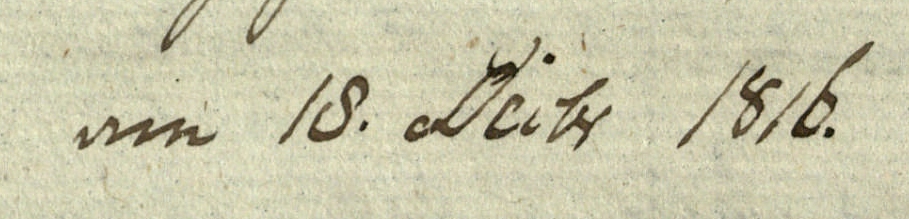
am 18. Decbr 1816.
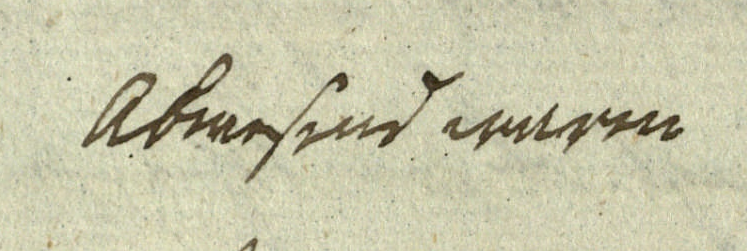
Abwesend waren
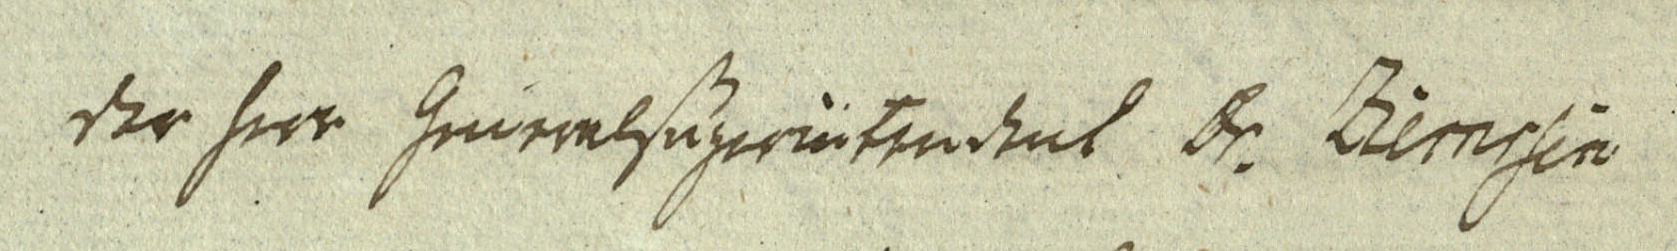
der Herr Generalsuperintendent Dr. Ziessen
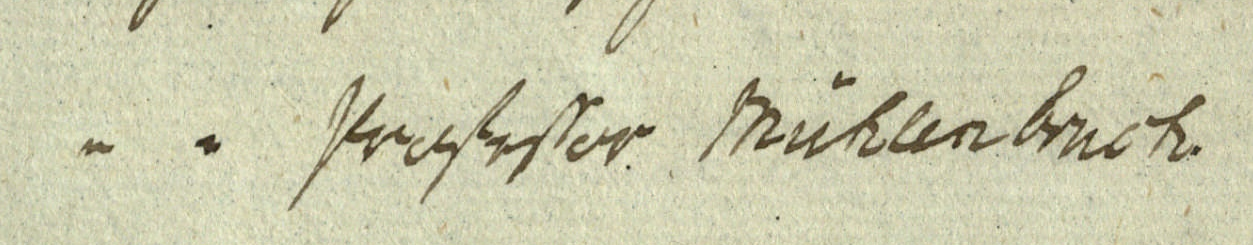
Professor Mühlenbruch.
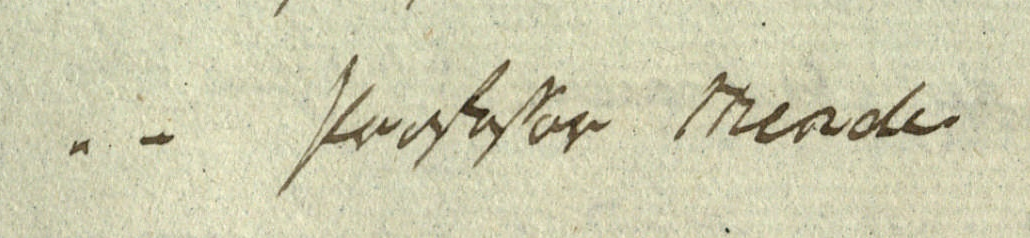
Professor Mende
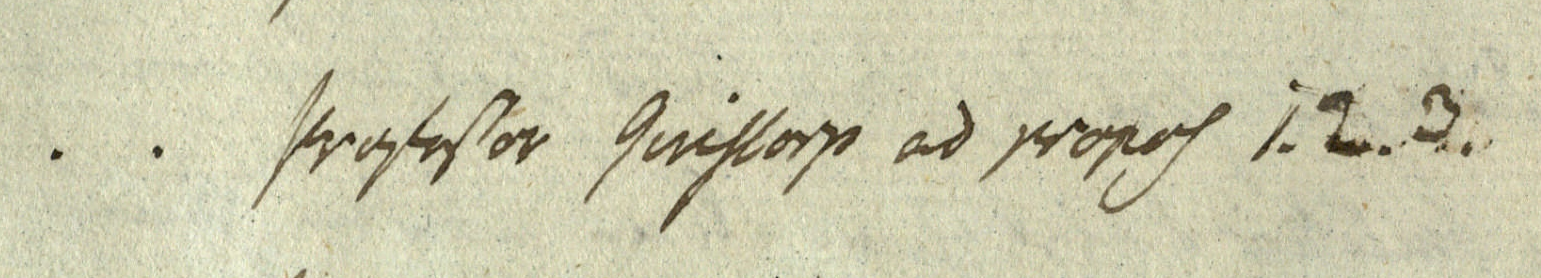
Professor Quistorp ad propos 1. 2. 3.
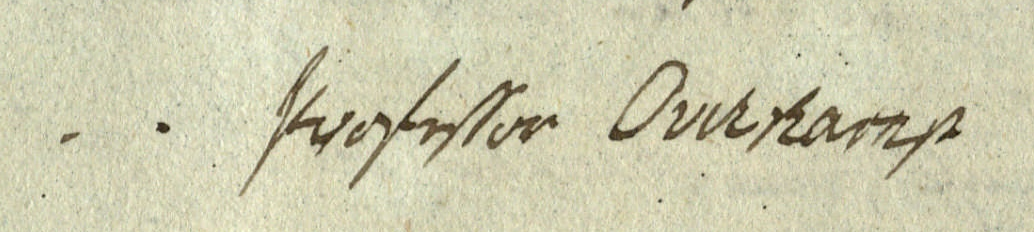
Professor Overkamp
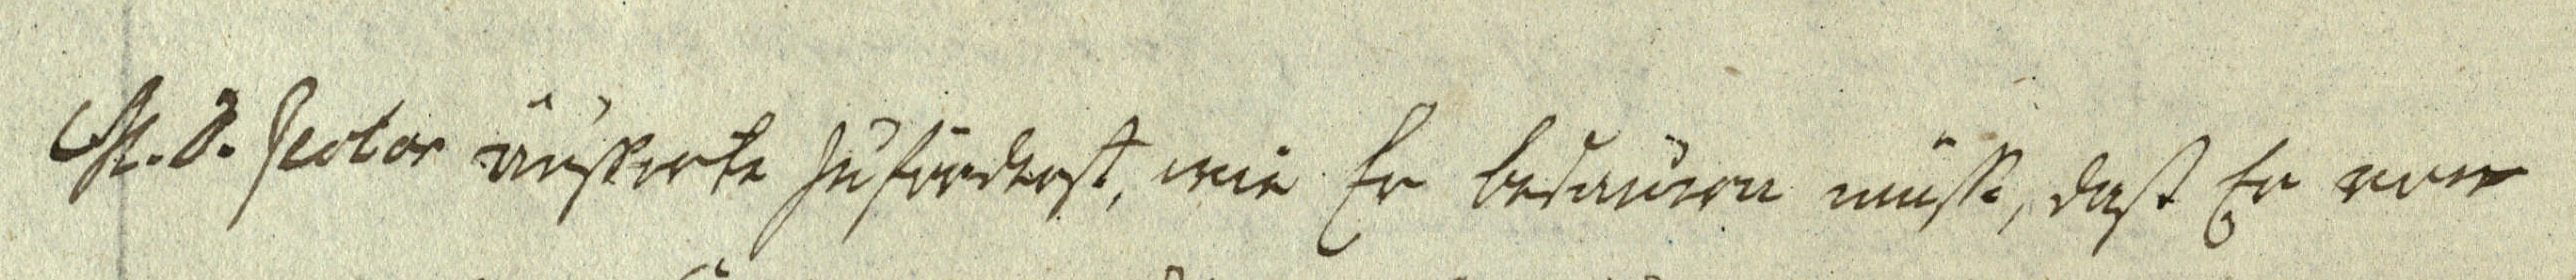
M. D. Rector äusserte zuförderst, wie Er bedauern müsse, daß Er von
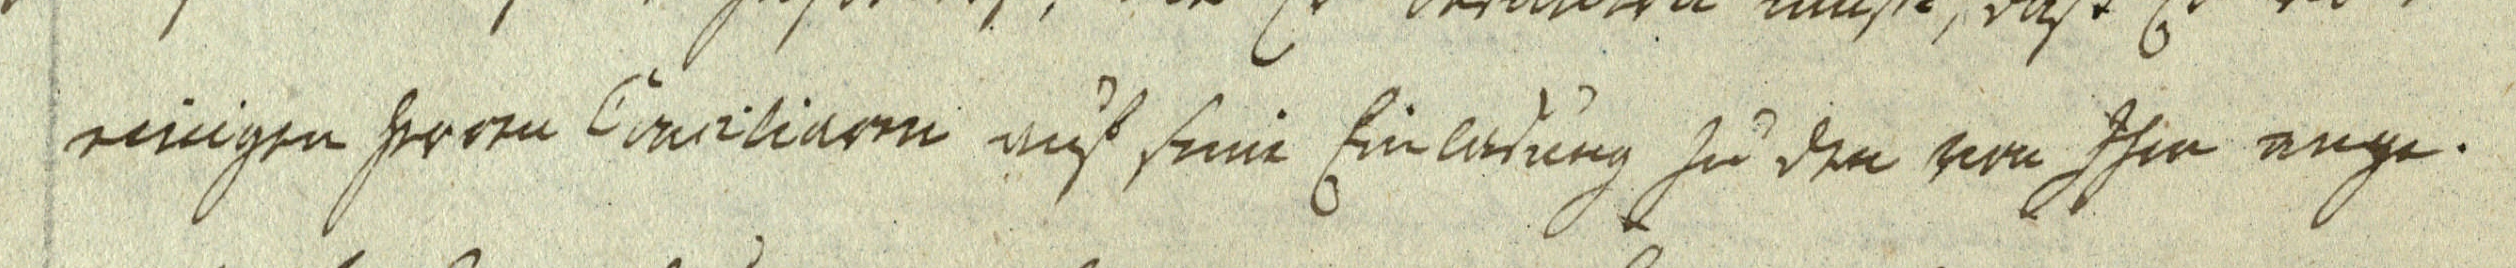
einigen Herren Conciliaren auf seine Einladung zu den von Ihm ange¬
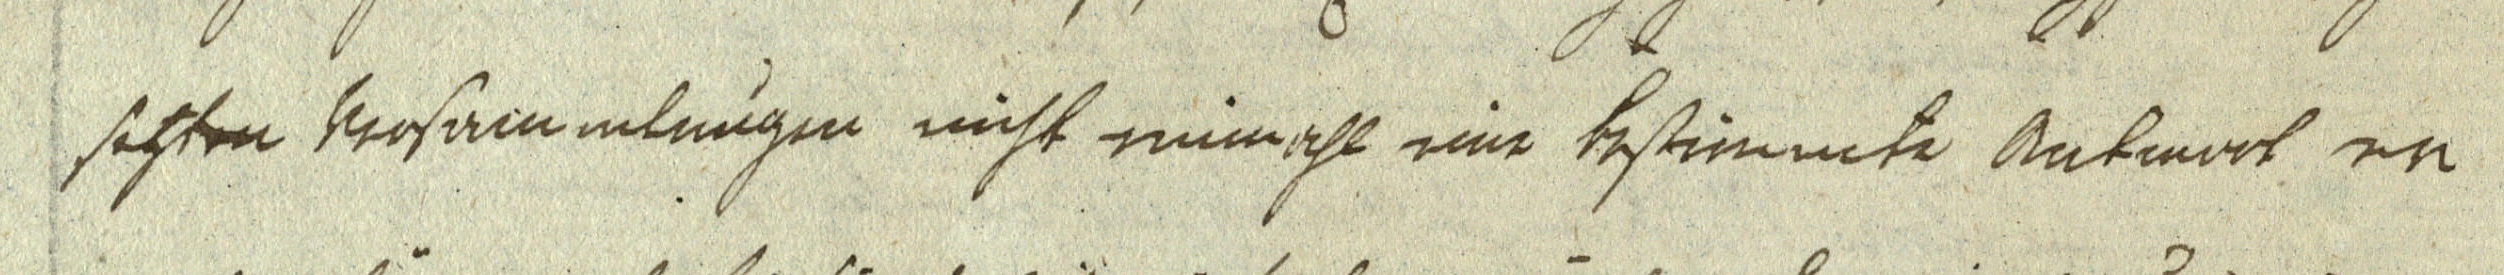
setzten Versammlungen nicht einmahl eine bestimmte Antwort er¬
